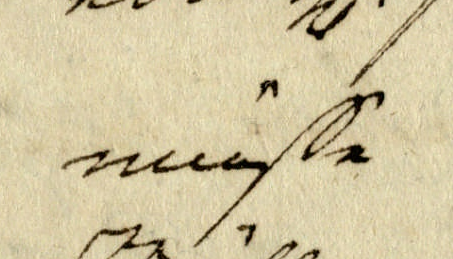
müsse
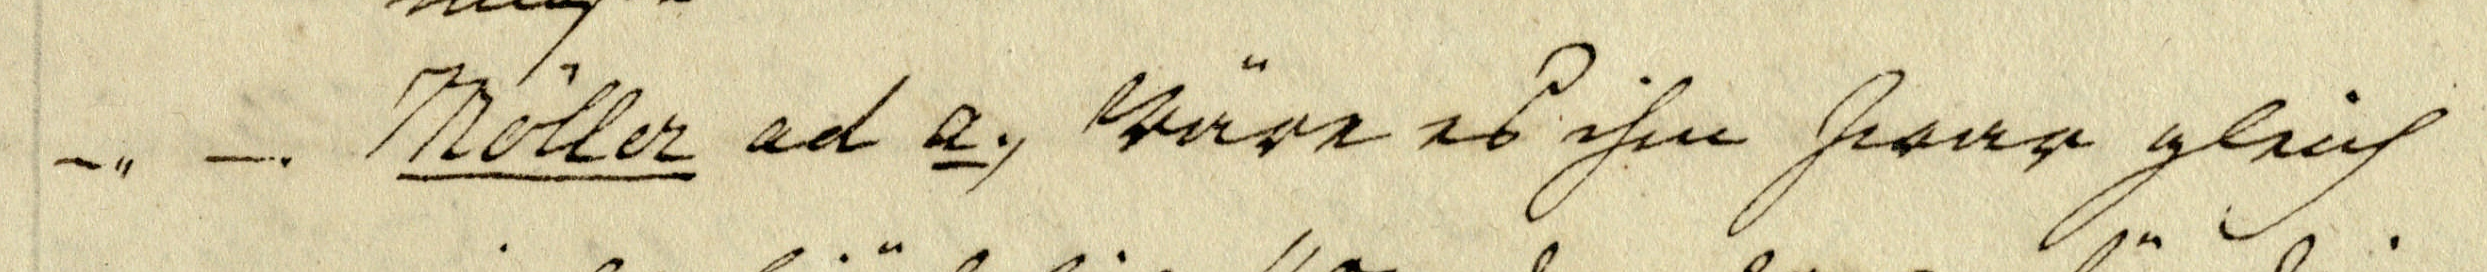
Möller ad a., Wäre es ihm zwar gleich
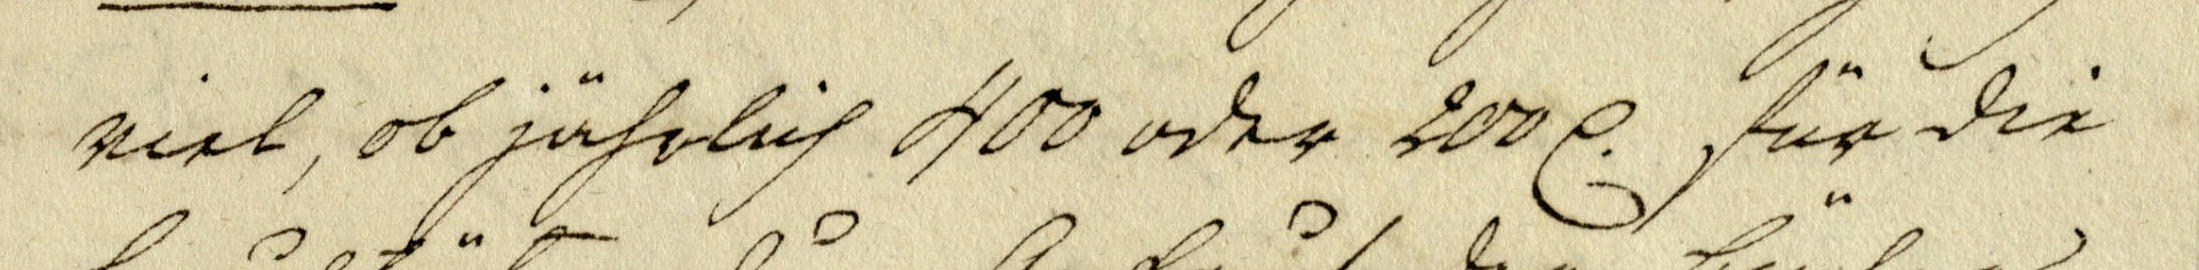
viel, ob jährlich 400 oder 200 l. für die
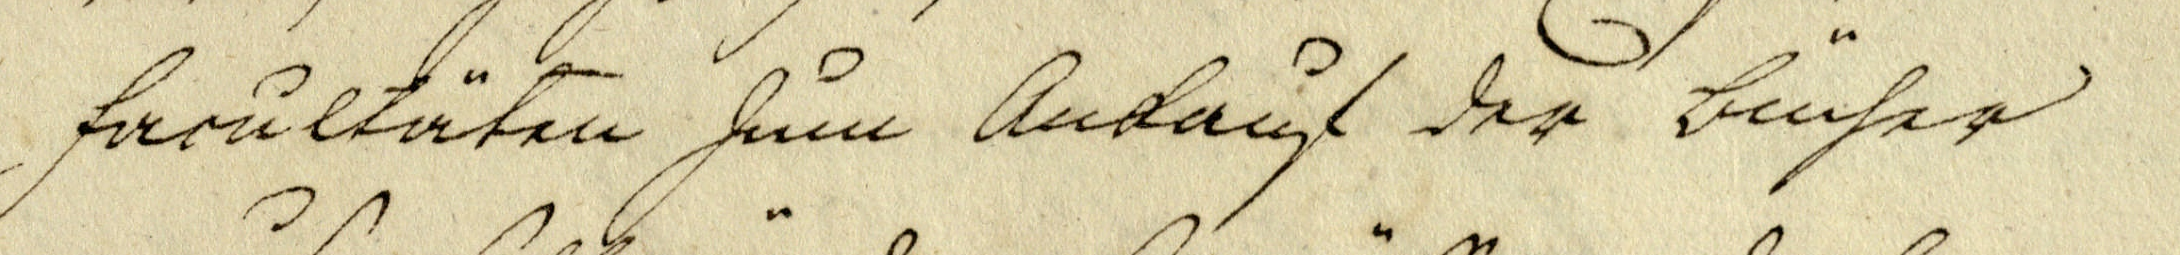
Facultäten zum Ankauf der Bücher
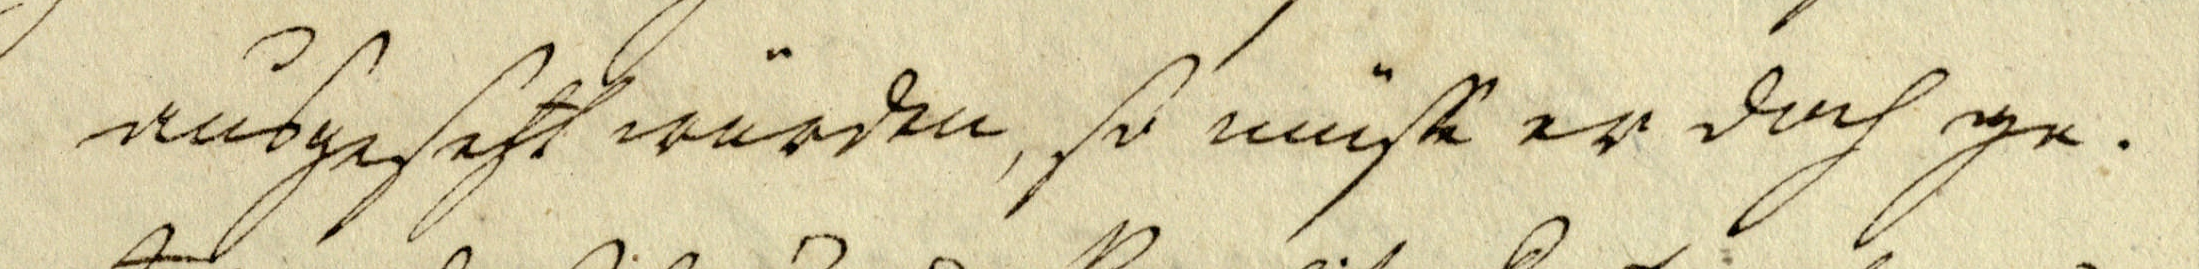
ausgesetzt würden, so müsse er doch ge¬
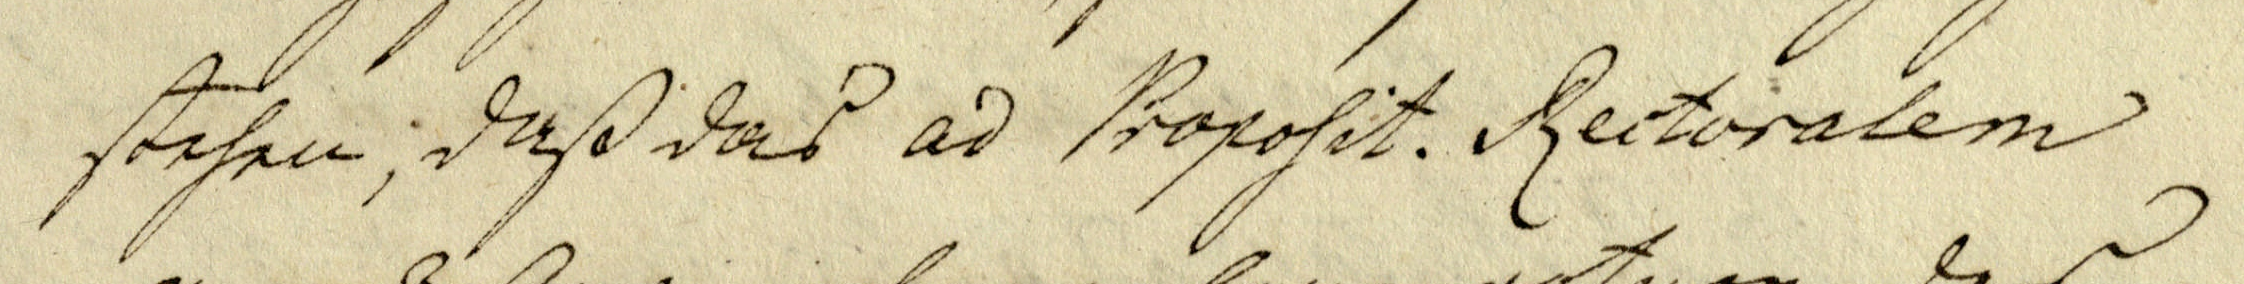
stehen, daß das ad Proposit. Rectoralem
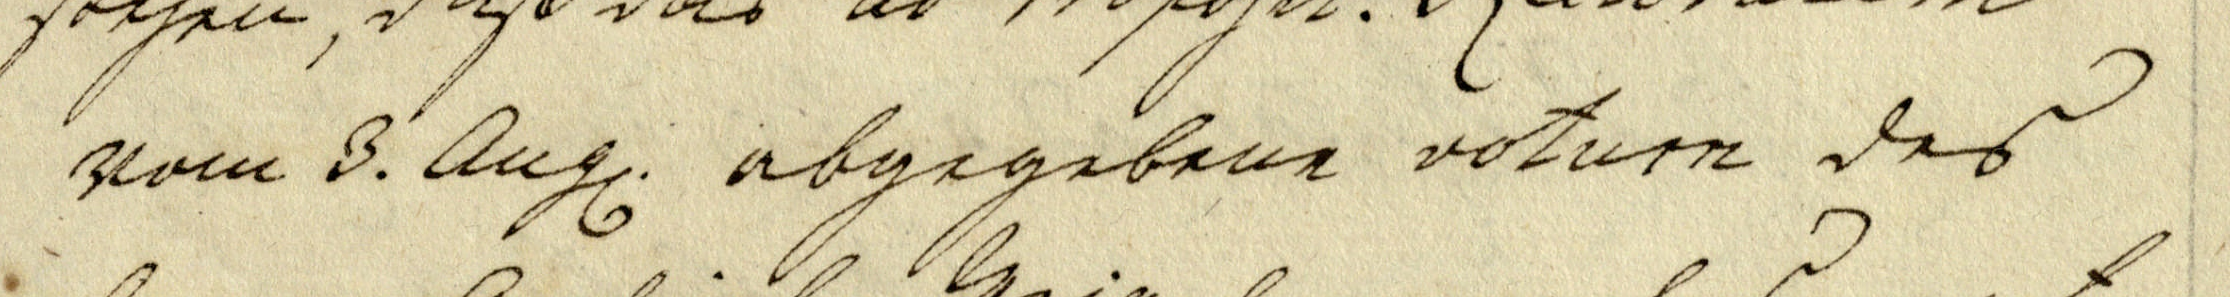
vom 3. Aug. abgegebene votum des
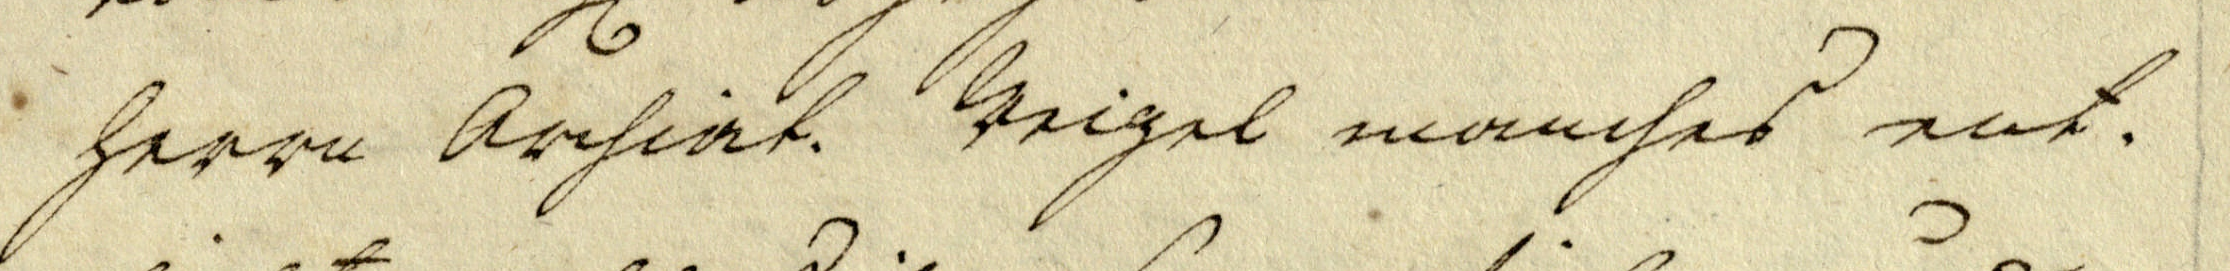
Herrn Archiat. Weigel manches ent¬
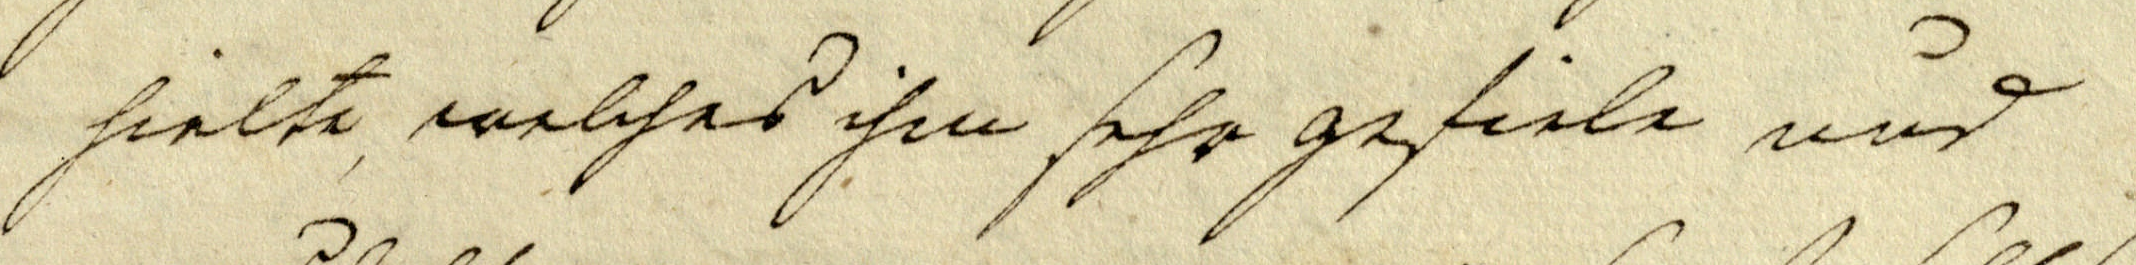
hielte, welches ihm sehr gefiele und
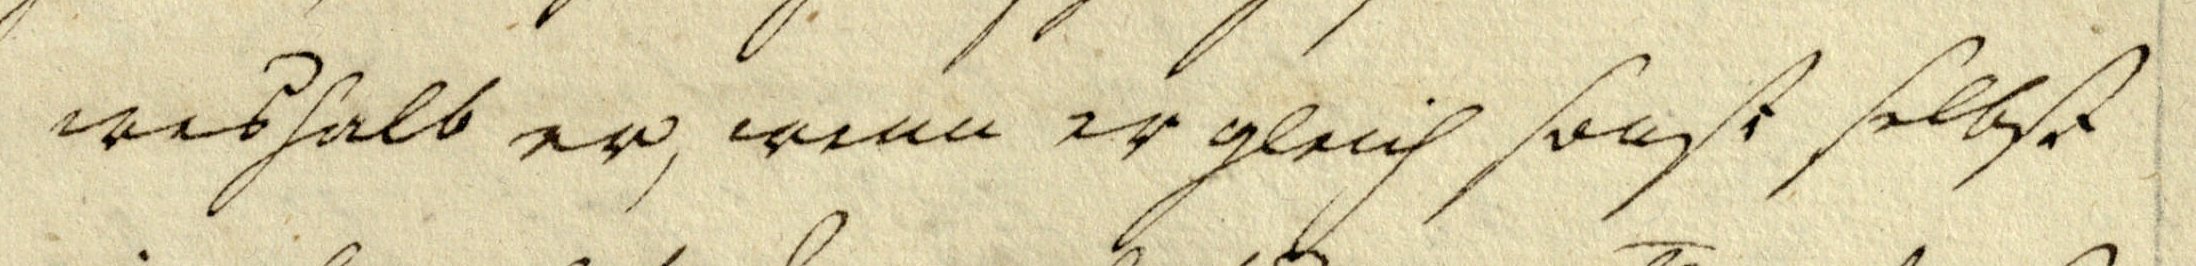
weshalb er, wenn er gleich sonst selbst
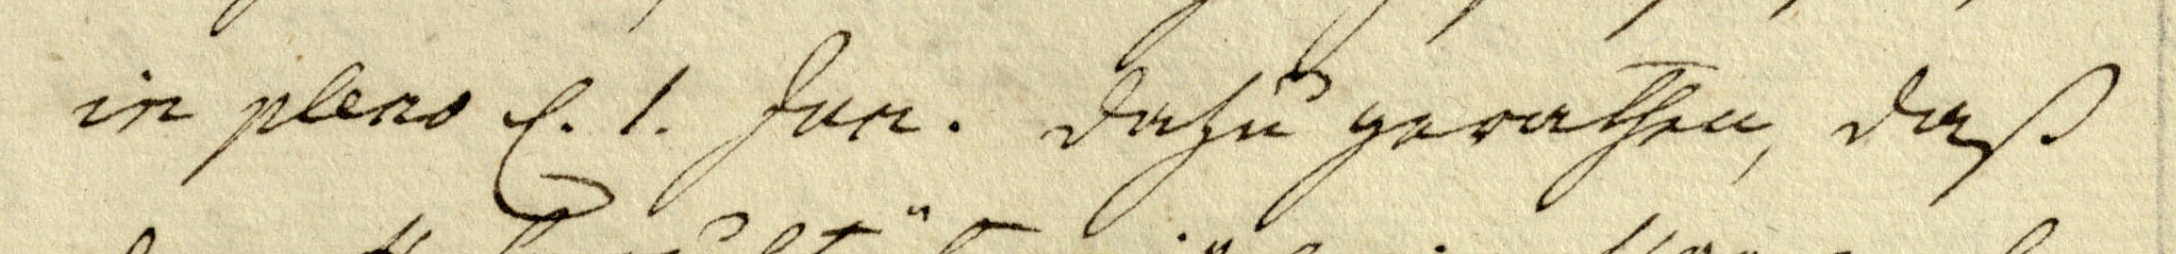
in pleno d. 1. Jun. dazu gerathen daß
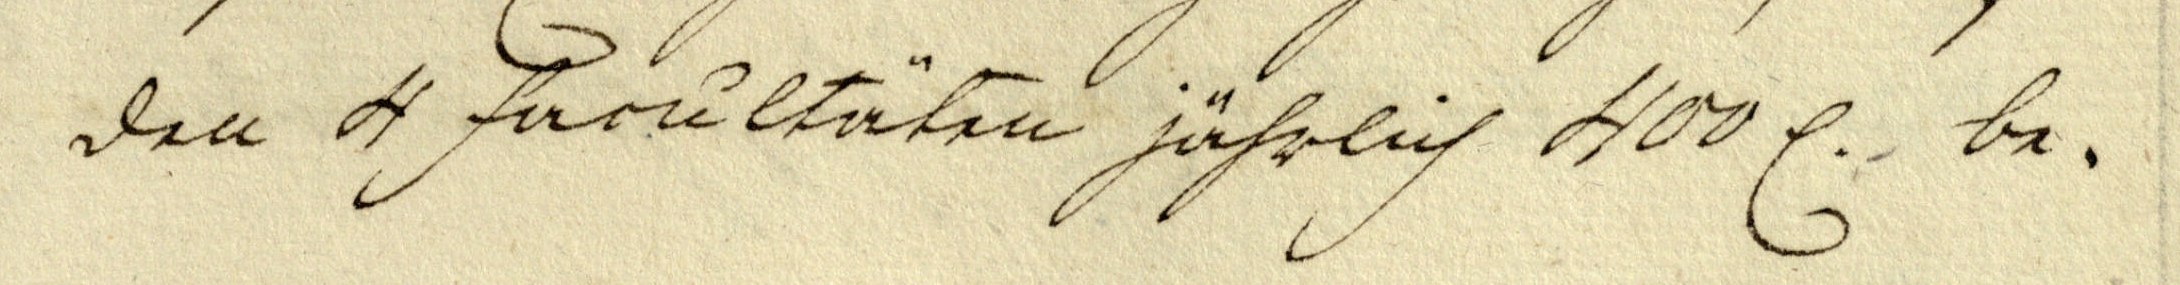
den 4 Facultäten jährlich 400 l. be¬
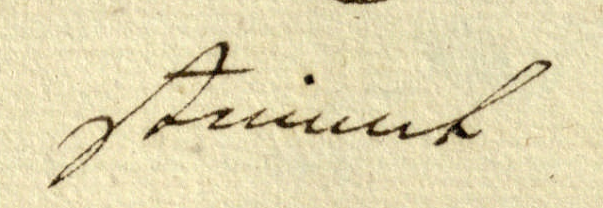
stimmt
